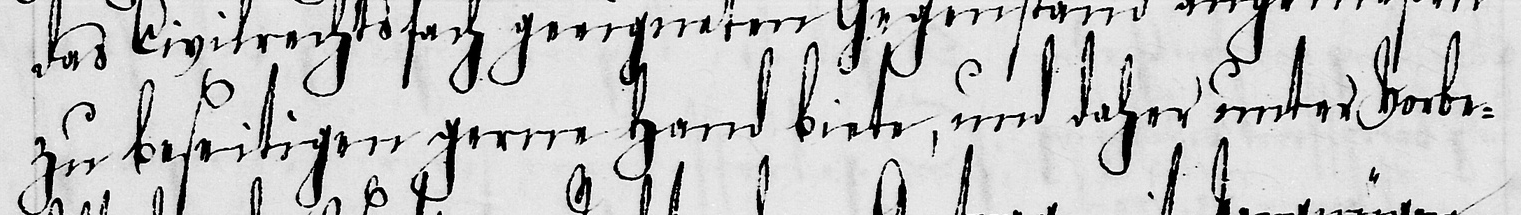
zu beseitigen gerne Hand biete, und daher unter Vorbe¬
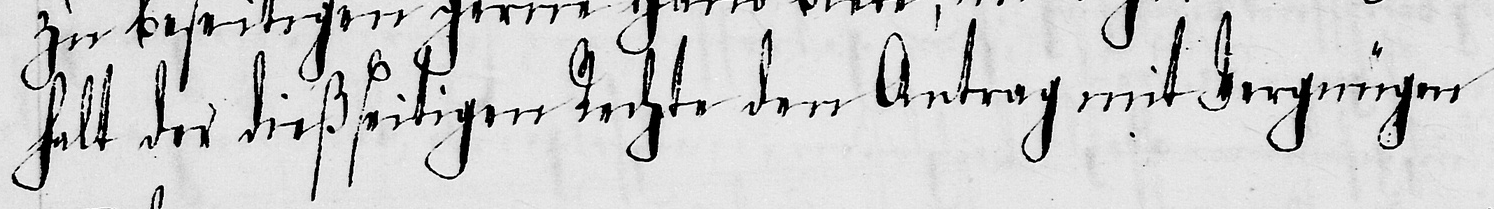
halt der dießseitigen Rechte den Antrag mit Vergnügen
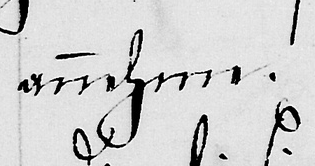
annehme.
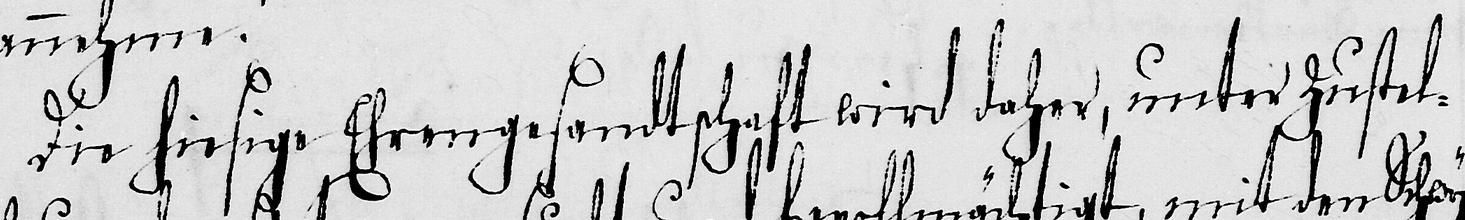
Die hiesige Ehrengesandtschaft wird daher, unter Zustel¬
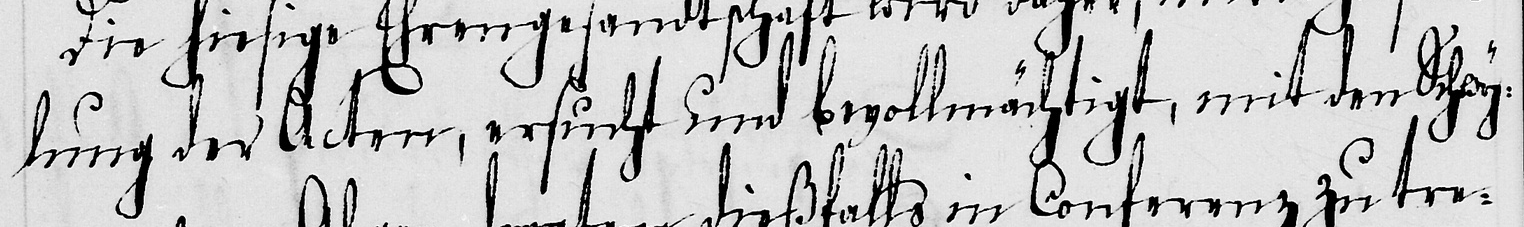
lung der Acten, ersucht und bevollmächtigt, mit den Schw¬
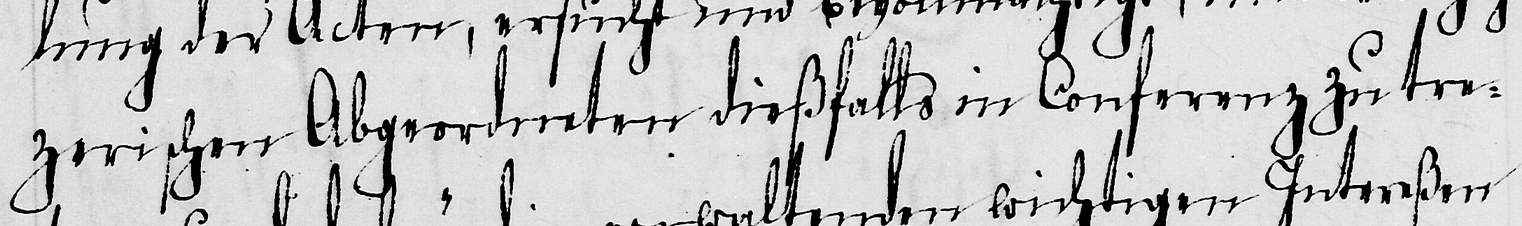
yzerischen Abgeordneten dießfalls in Conferenz zu tre¬
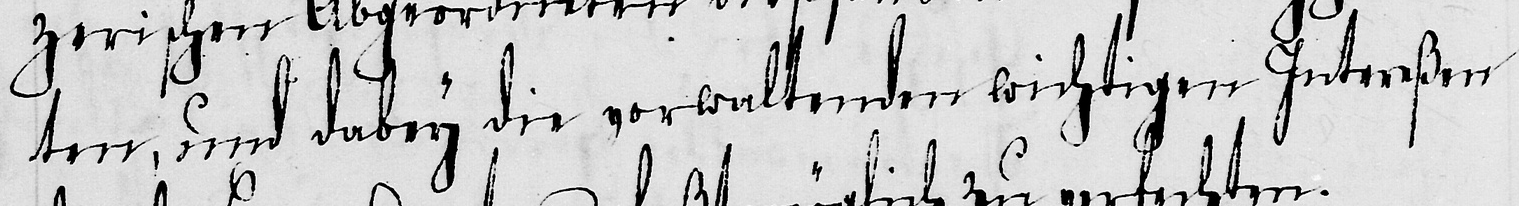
ten, und dabey die vorwaltenden wichtigen Intereßen
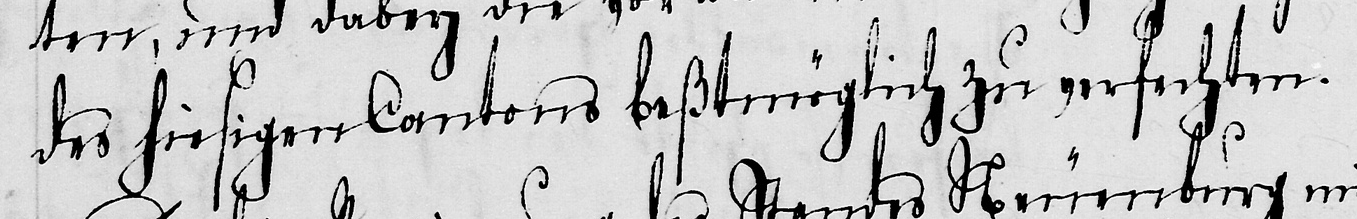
des hiesigen Cantons beßtmöglich zu verfechten.
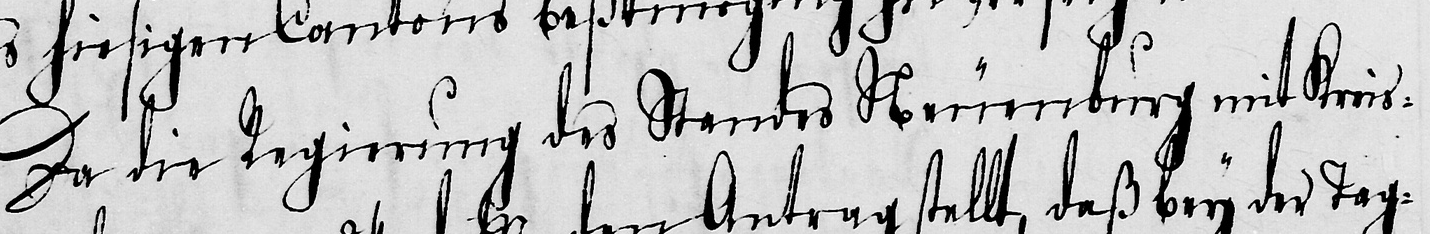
Da die Regierung des Standes Neuenburg mit Kreis¬
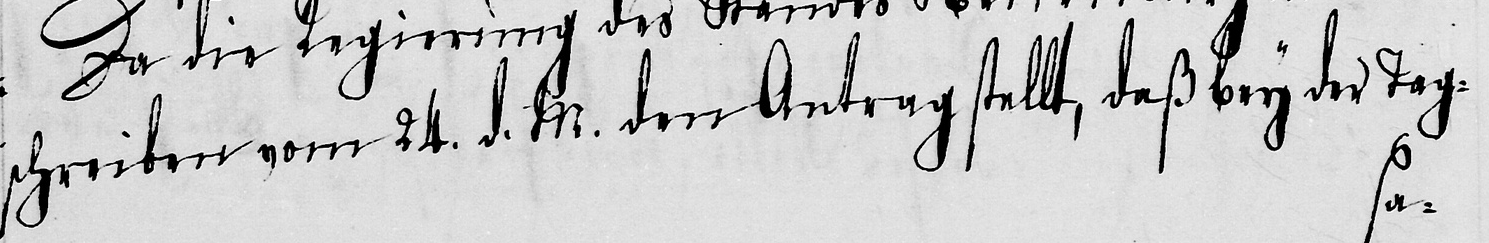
chreiben vom 24. d. M. den Antrag stellt, daß bey der Tag-
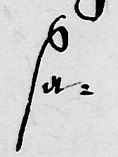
s¬
